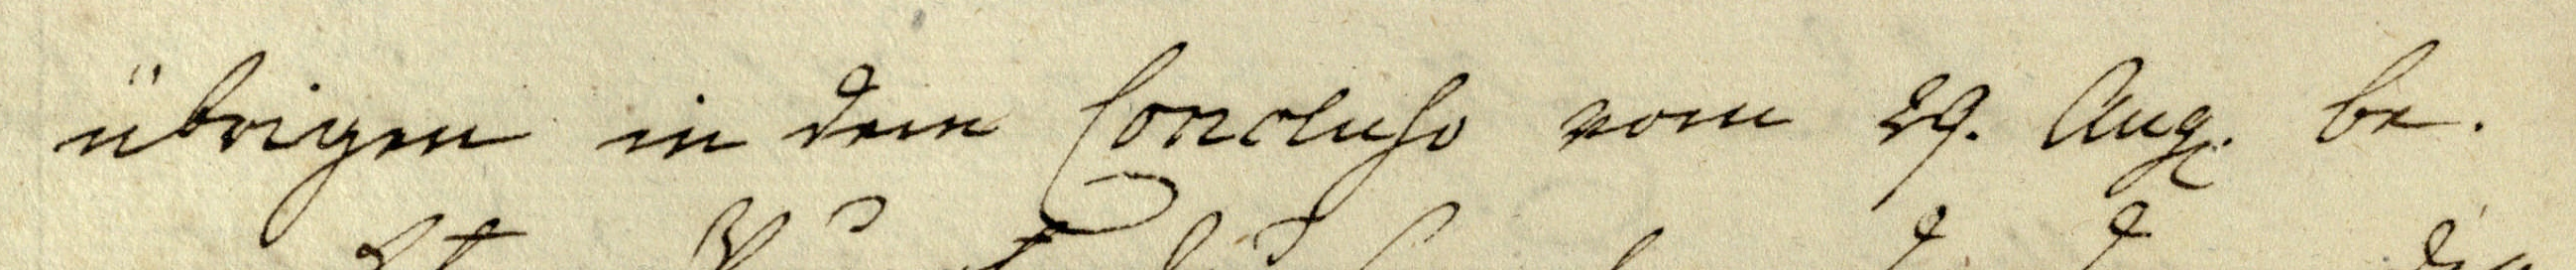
übrigen in dem Concluso vom 29. Aug. be¬
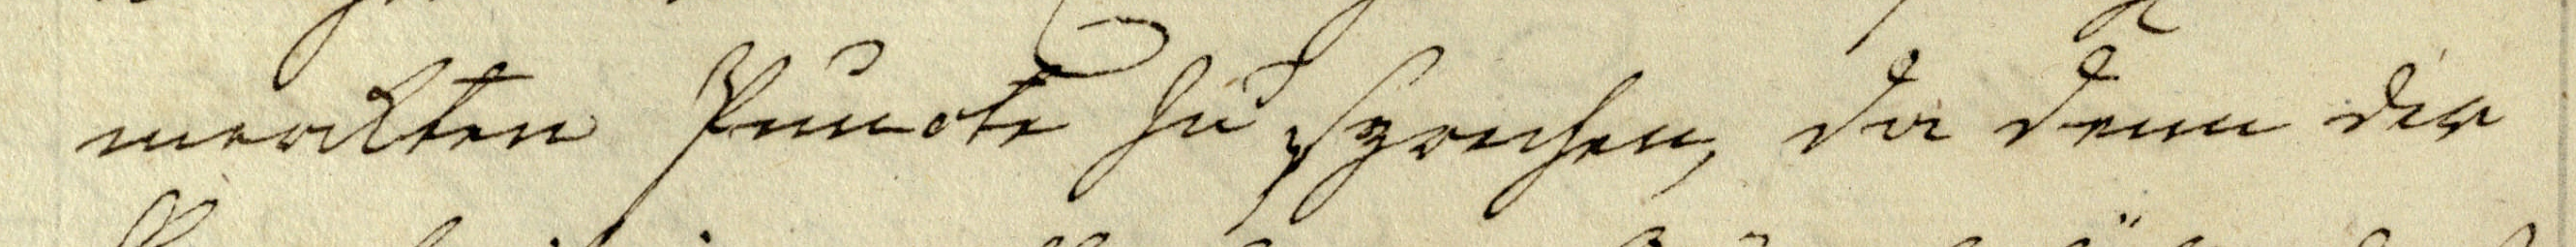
merckten Puncte zu sprechen, die denn der
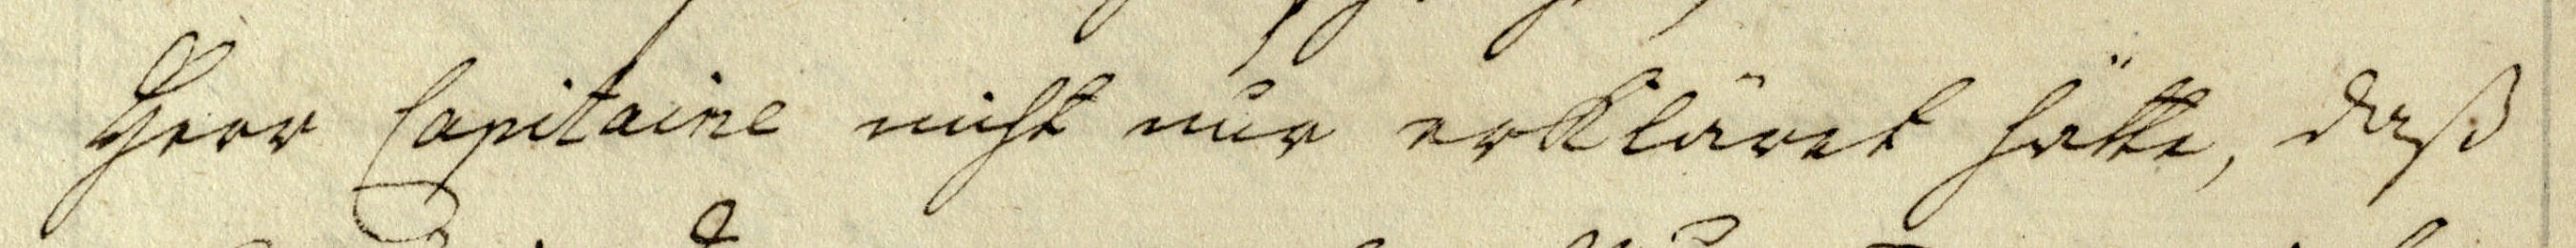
Herr Capitaine nicht nur erkläret hätte, daß
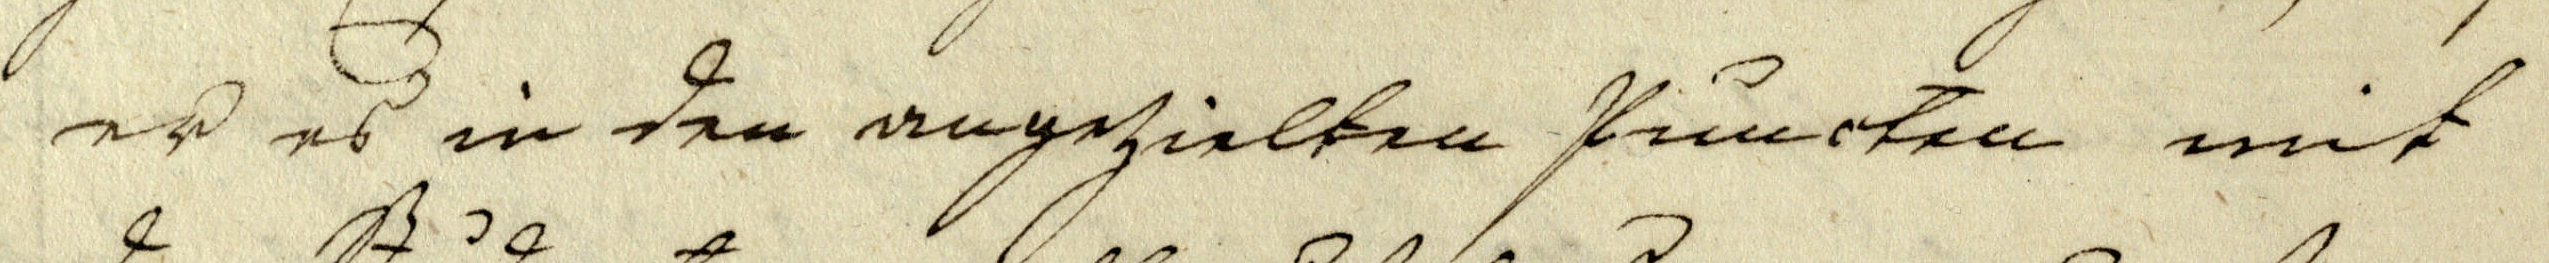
er es in den angezielten Puncten mit
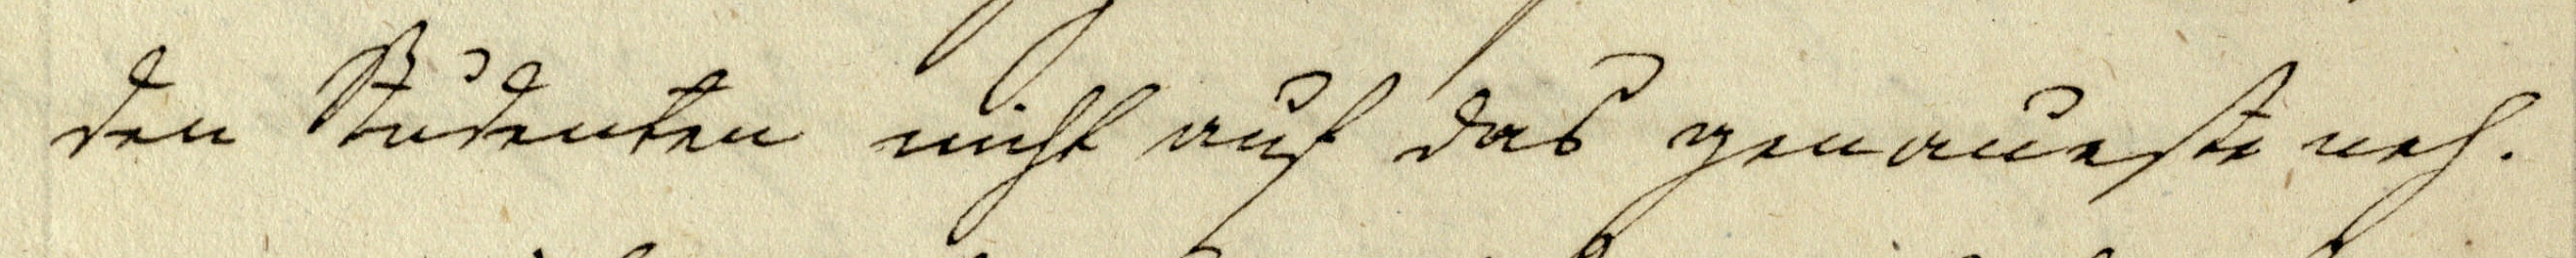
den Studenten nicht auf das genaueste neh¬
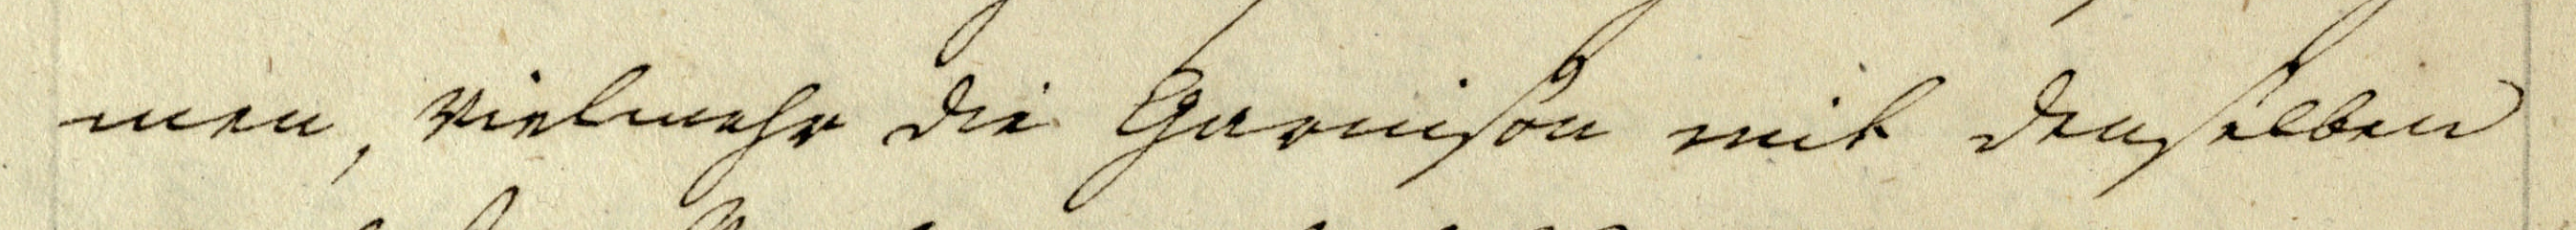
men, vielmehr die Garnison mit denselben
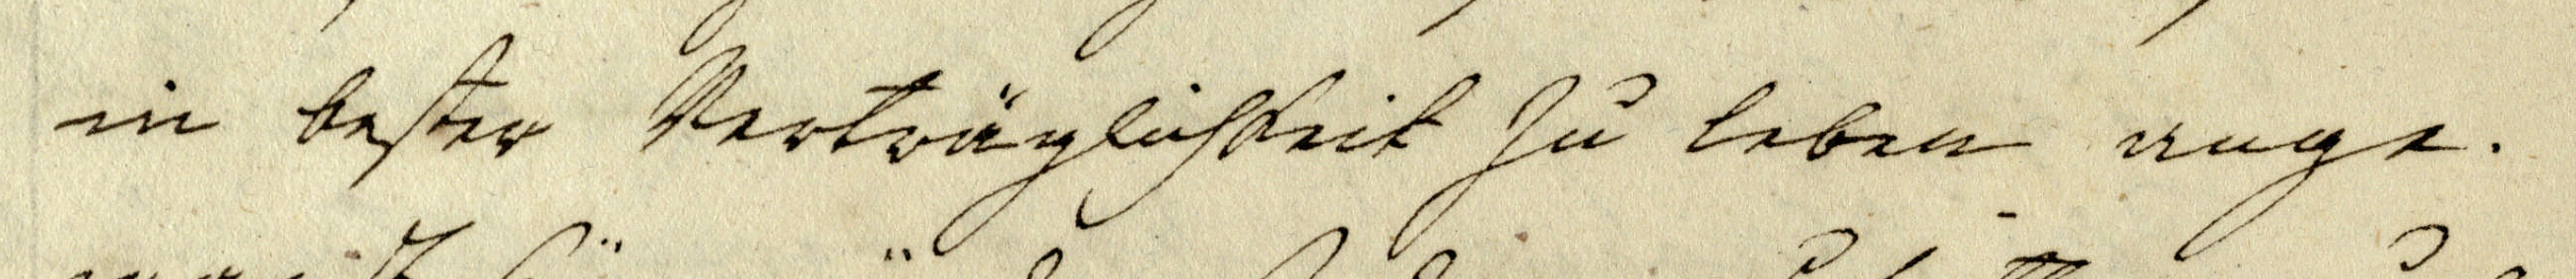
in bester Verträglichkeit zu leben ange¬
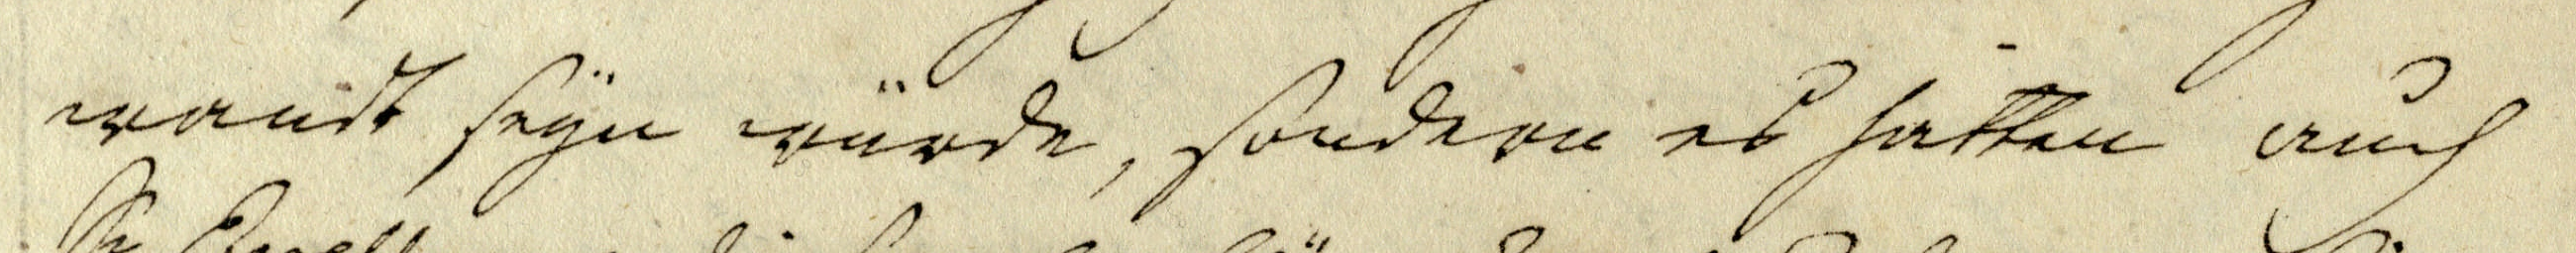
wandt seÿn würde, sondern es hätten auch
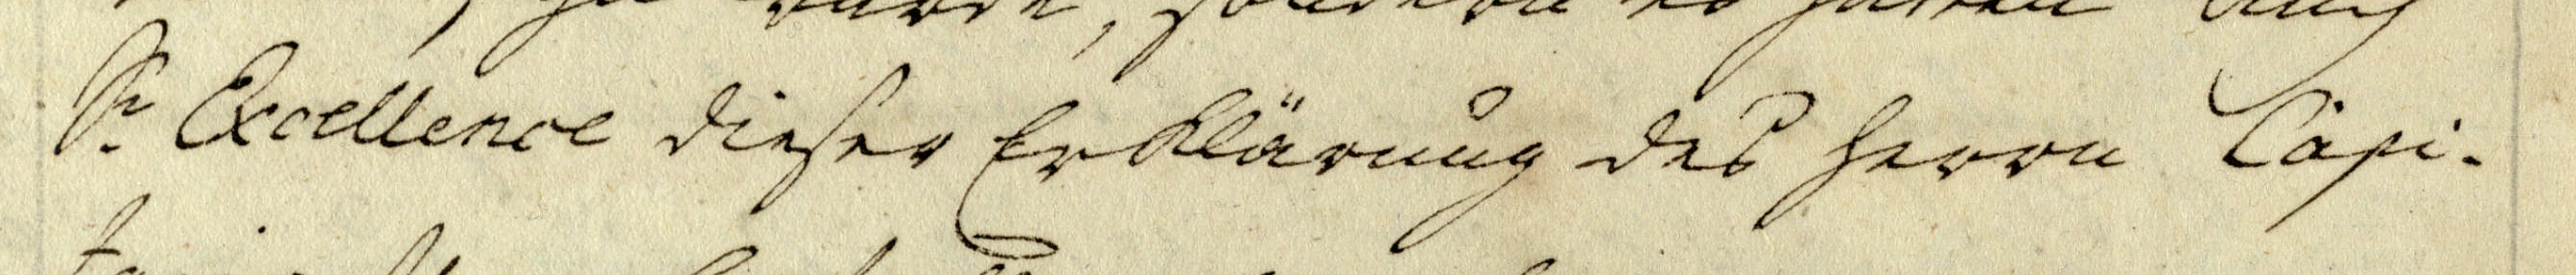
Sr Excellence dieser Erklärung des Herrn Capi¬.
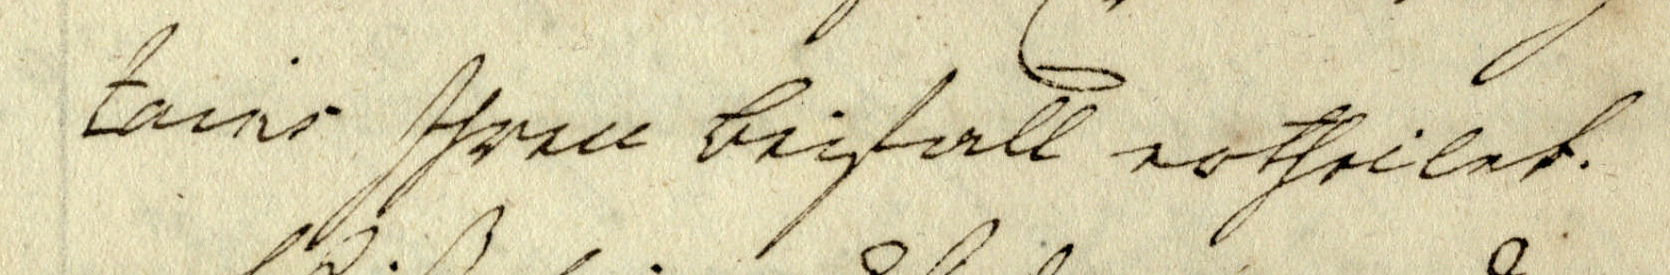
tains Ihren Beifall ertheilet.
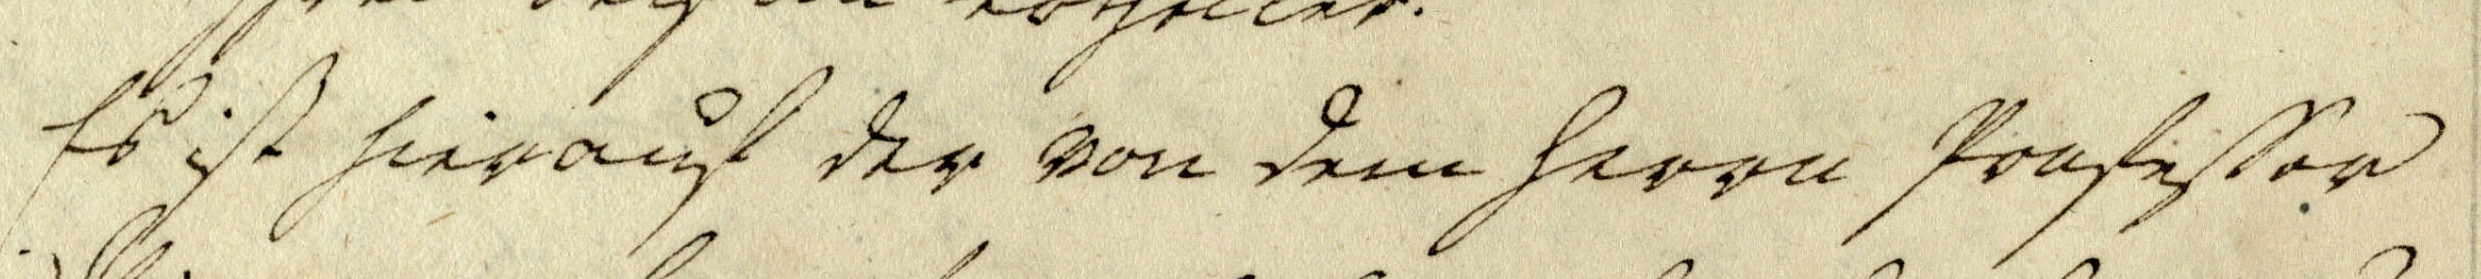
Es so hierauf der von dem Herrn Professor
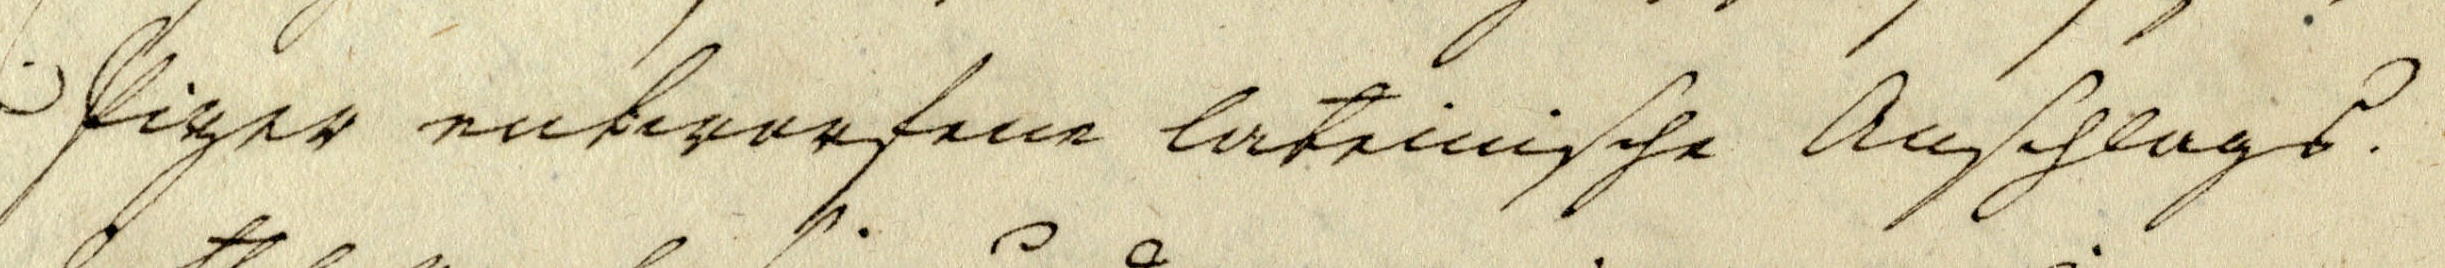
Piper entworfene lateinische Anschlags¬
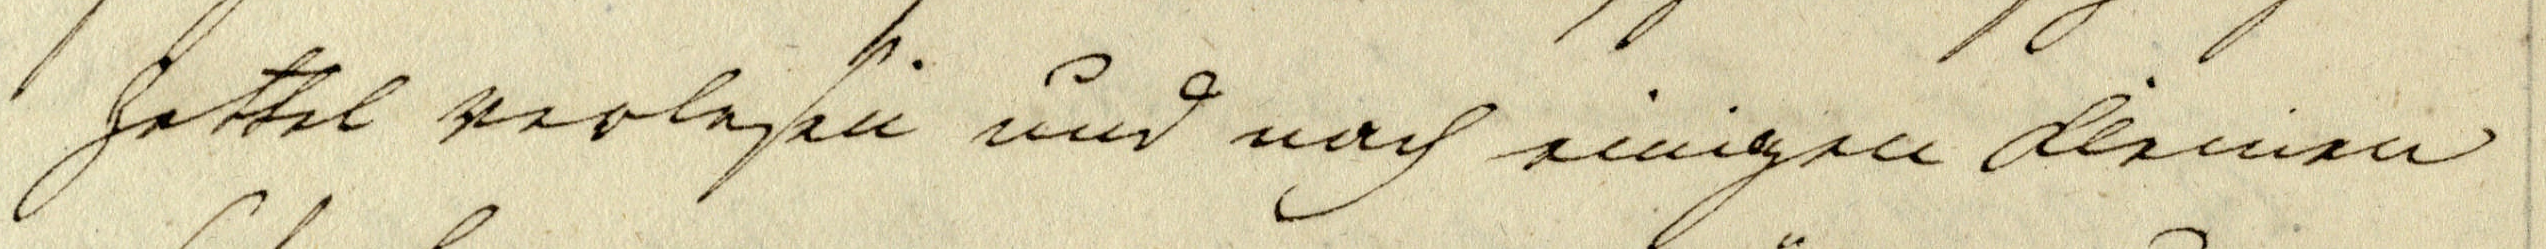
zettel verlesen und nach einigen kleinen
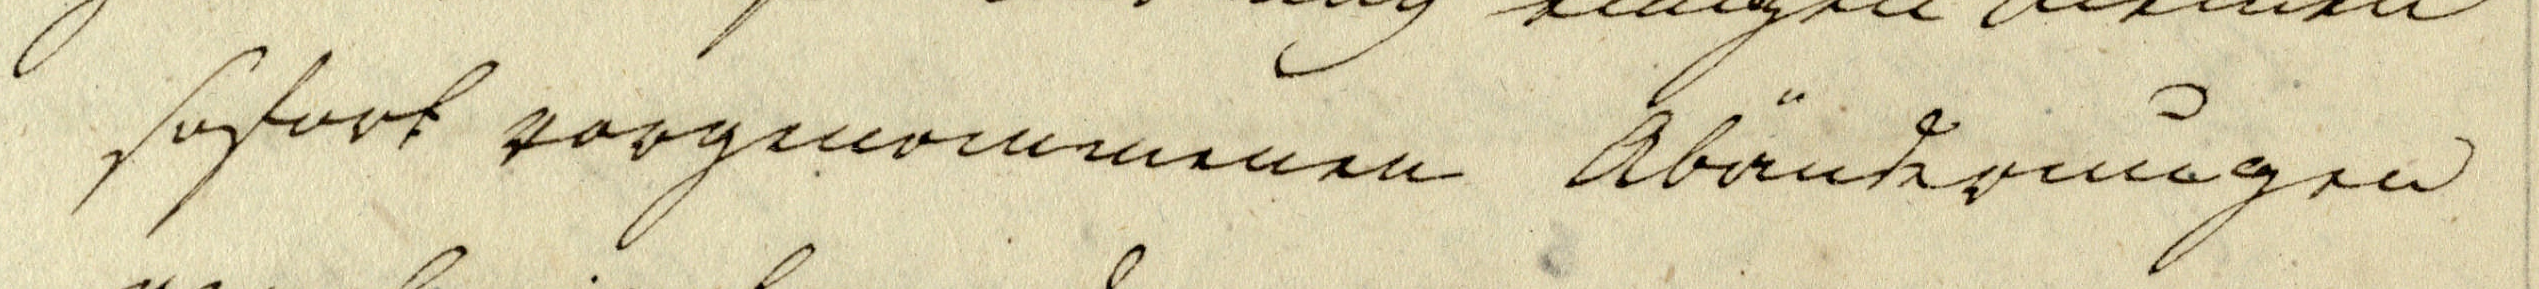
sofort vorgenommenen Abänderungen
